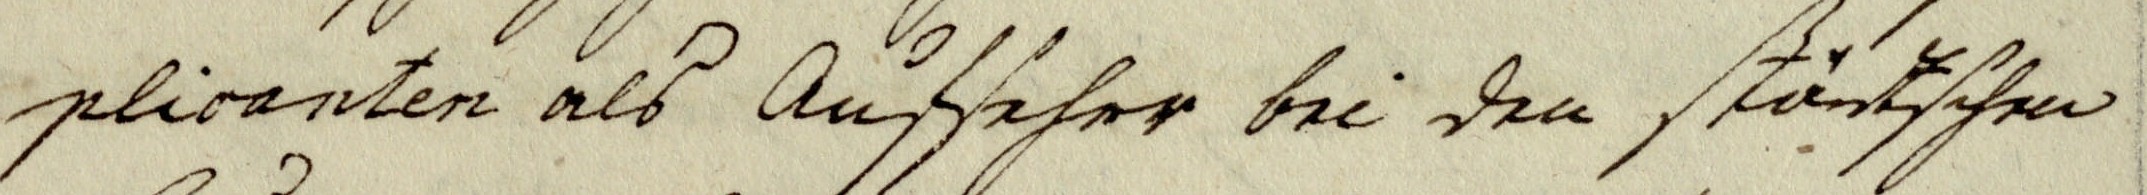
plicanten als Aufseher bei den städtischen
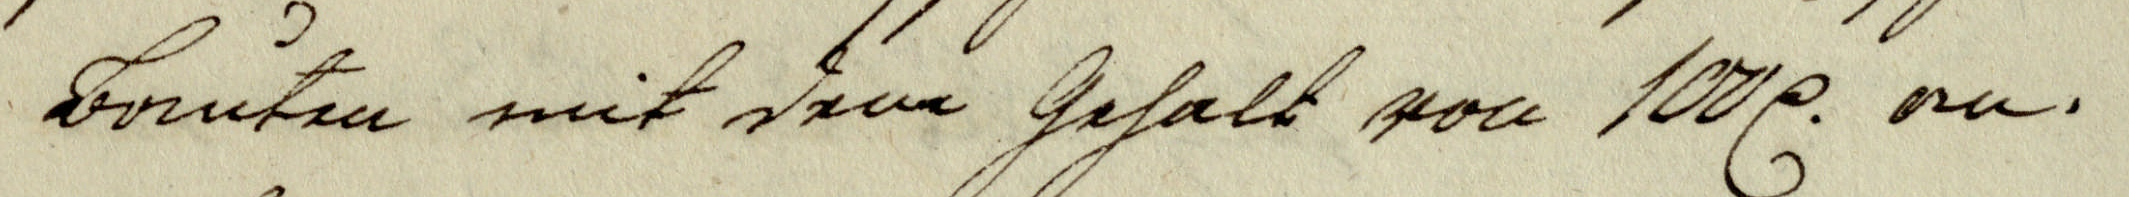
Bauten mit dem Gehalt von 100 rtl. an¬
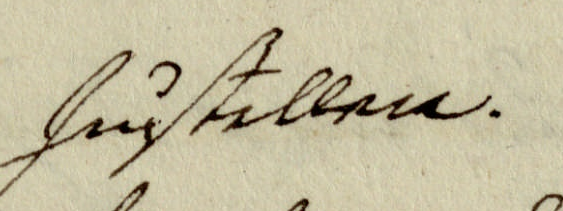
zustellen.
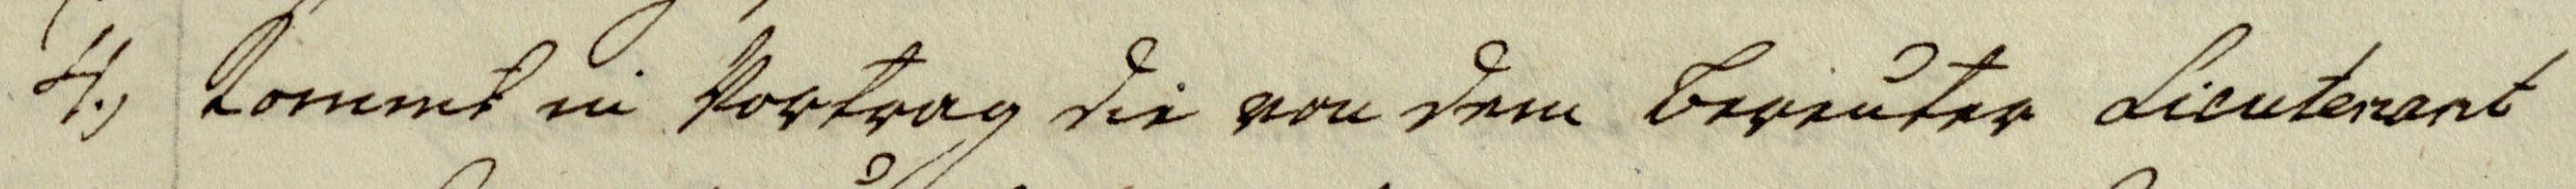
4., Kommt in Vortrag die von dem Bereuter Lieutenant
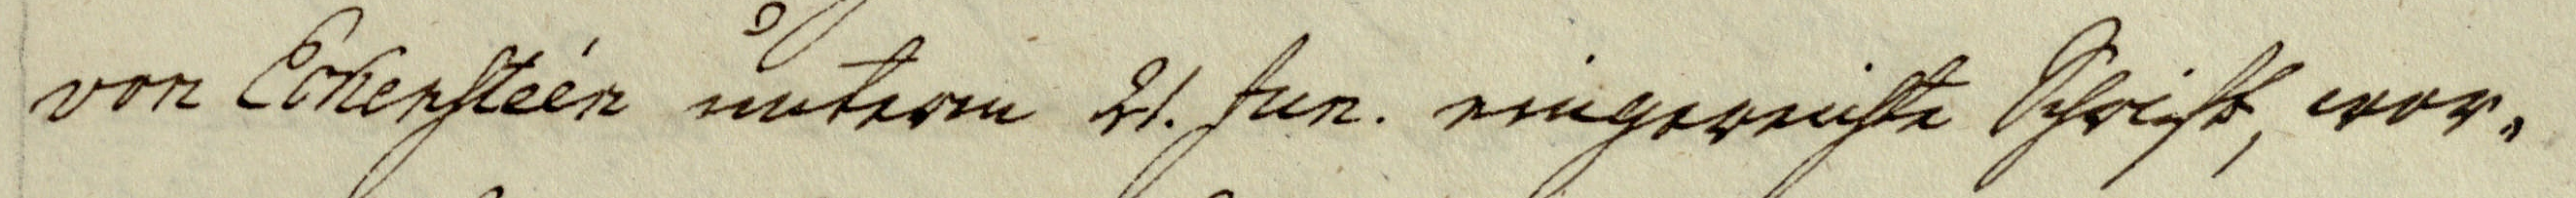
von Eckensteén unterm 21. Jun. eingereichte Schrift, wor¬
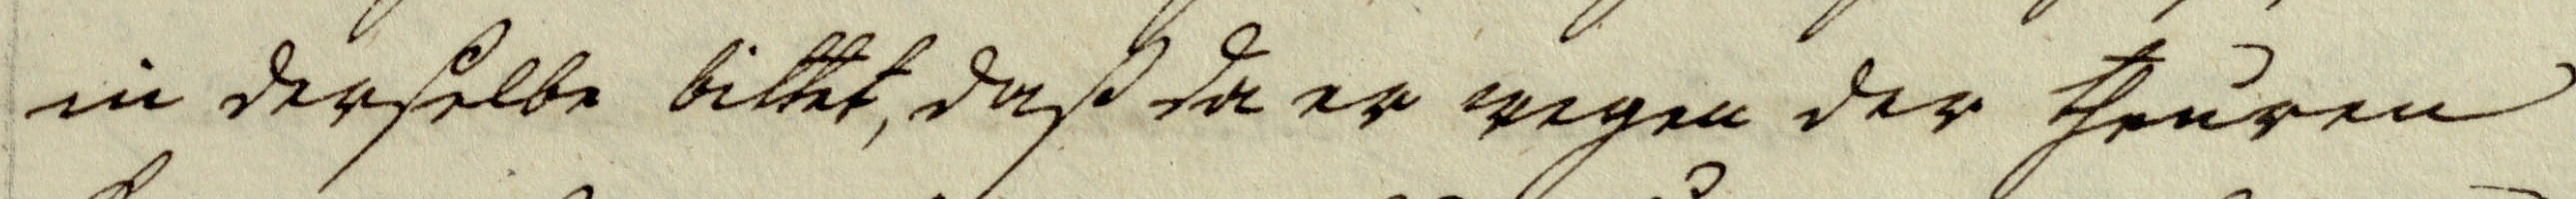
in derselbe bittet, daß da er wegen der theuren
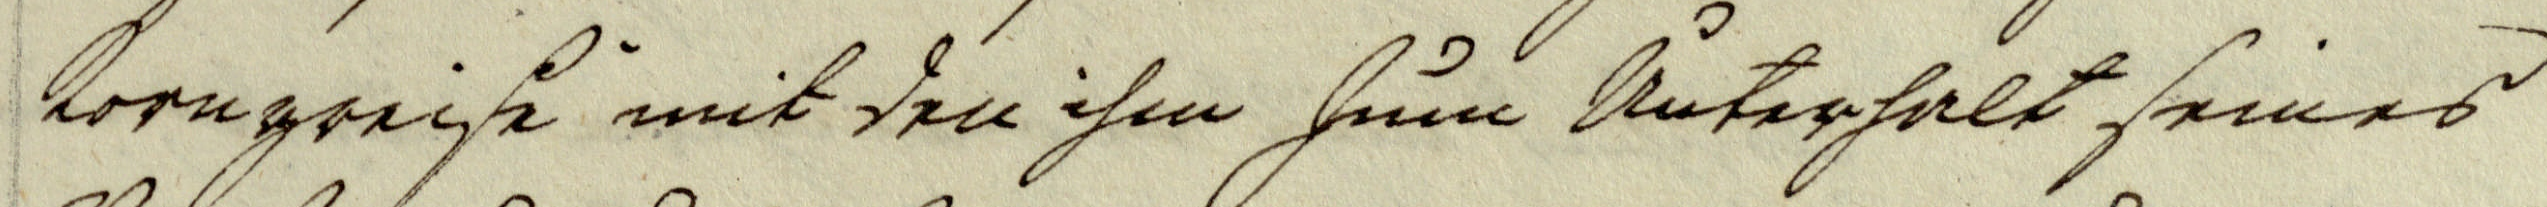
Kornpreise mit den ihm zum Unterhalt seines
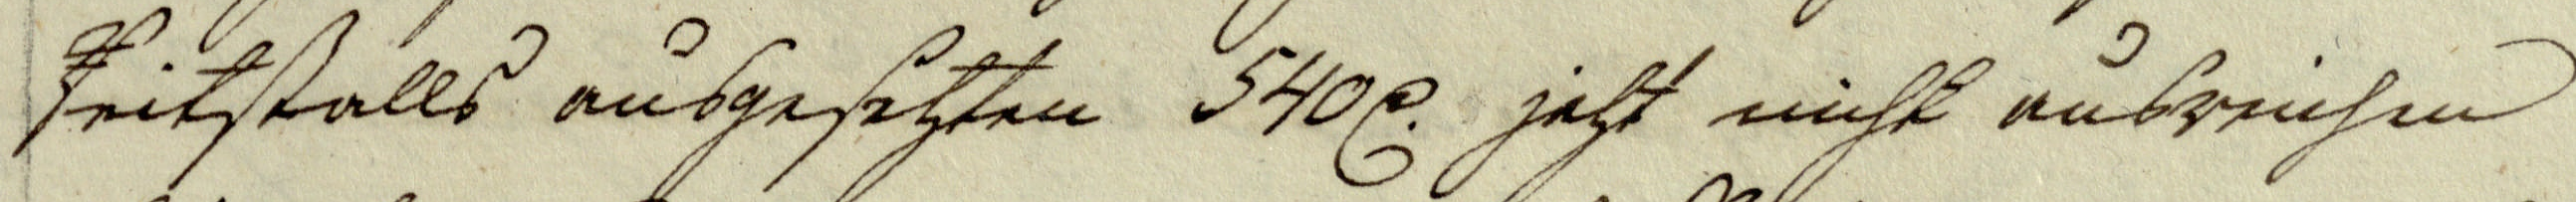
Reitstalls ausgesetzten 540 rtl. jetzt nicht ausreichen
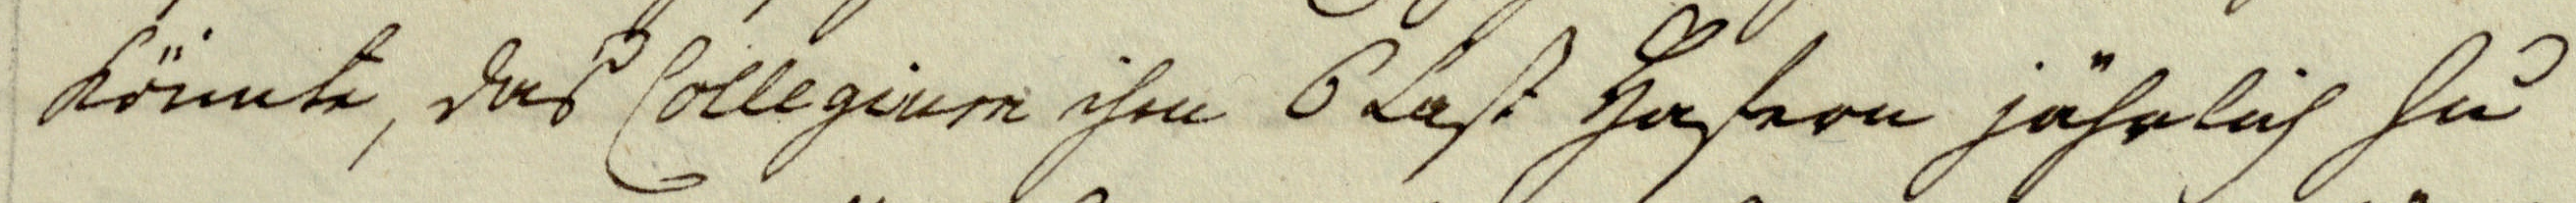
könnte, das Collegium ihm 6 Last Hafern jährlich zu
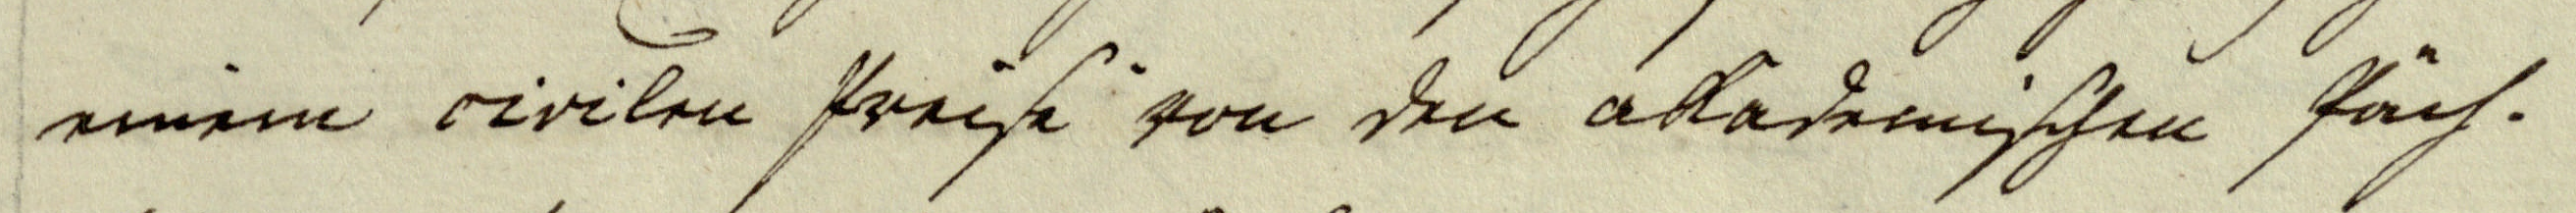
einem civilen Preise von den akademischen Päch¬
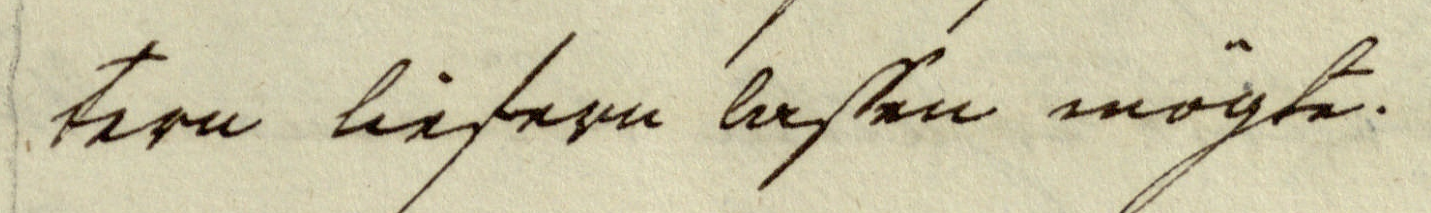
tern liefern lassen möchte.
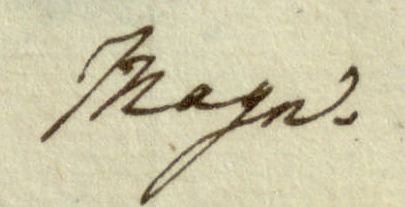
Magn.
